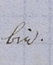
bin.
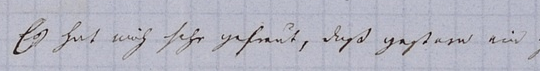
Es hat mich sehr gefreut, daß gestern ein
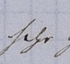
sehr
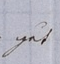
gut
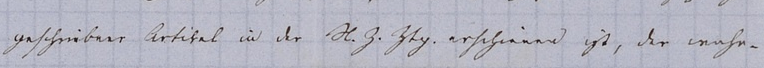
geschriebner Artikel in der N. Z. Ztg. erschienen ist, der wahr-
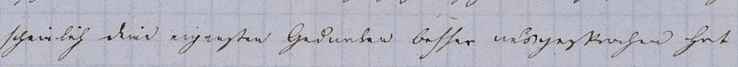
scheinlich Deine eigensten Gedanken besser ausgesprochen hat
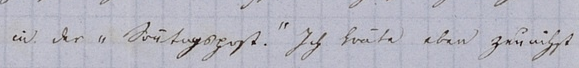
in der «Sonntagspost». Ich konnte eben zunächst
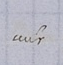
nur
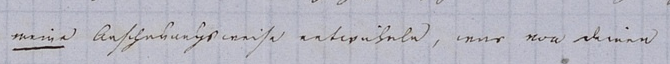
meine Anschauungsweise entwickeln, war von Deinen
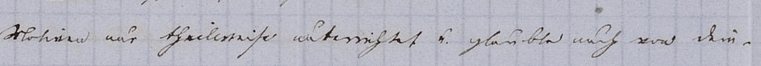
Motiven nur theilweise unterrichtet u. glaubte auch von Dein-
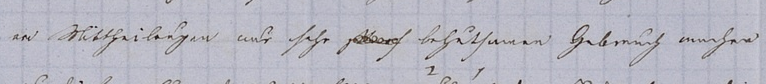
en Mittheilungen nur sehr schwach behutsamen Gebrauch machen
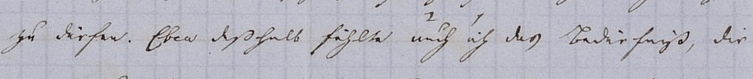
zu dürfen. Eben deßhalb fühlte ich auch das Bedürfniß, Dir
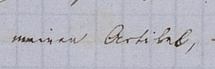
meinen Artikel,
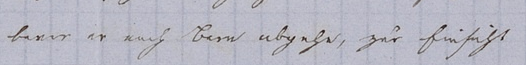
bevor er nach Bern abgehe, zur Einsicht
